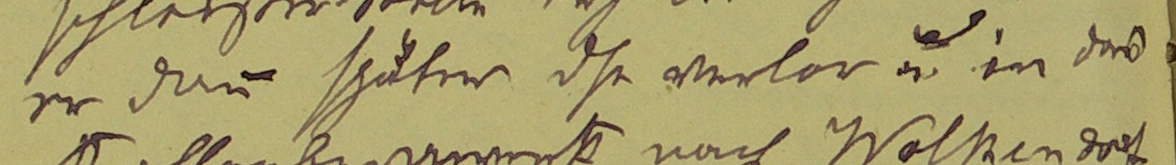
er dann später dse verlor u. in das
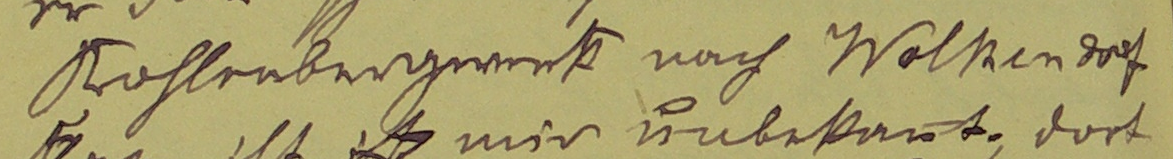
Kohlenbergwerk nach ???
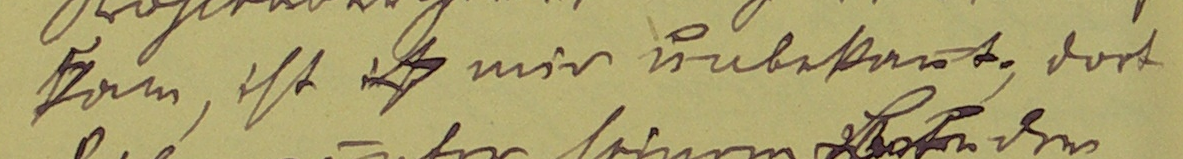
kam, ist ??? mir unbekannt; dort
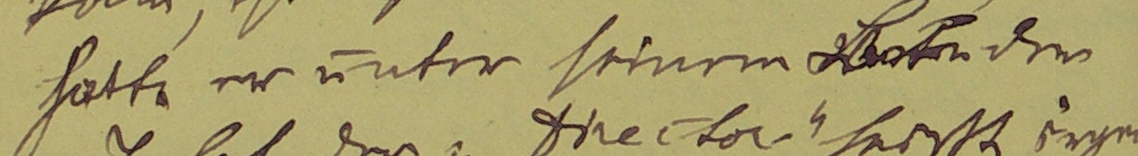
hatte er unter seinem Bruder
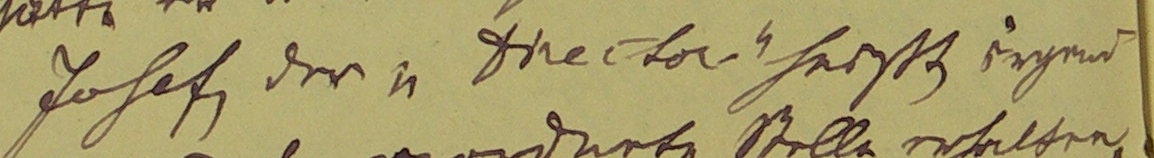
Josef, der „???“ heißt, irgend¬
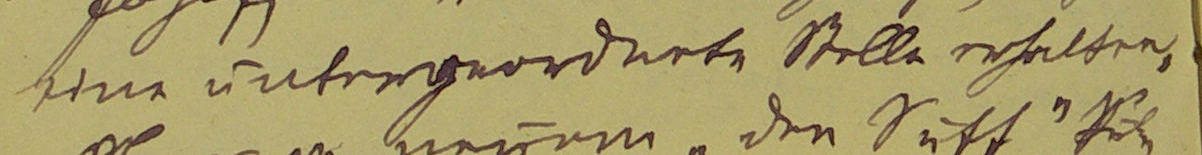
eine untergeordnete Stelle erhalten.
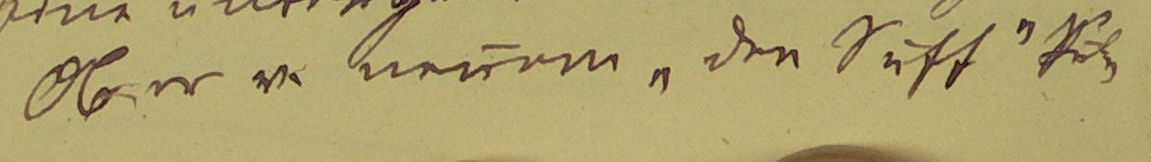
Ob er v. neuem „den Suff“ kul¬
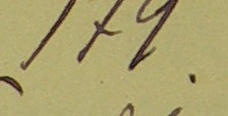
179
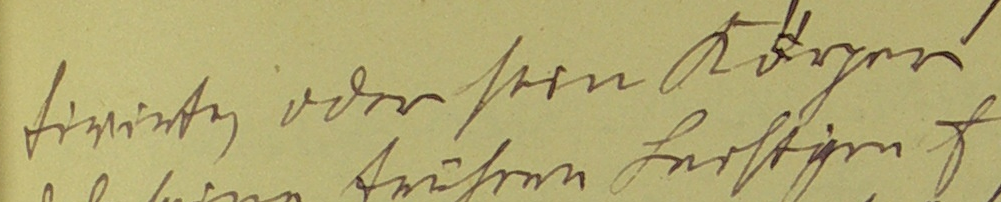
tivierte oder sein Körper
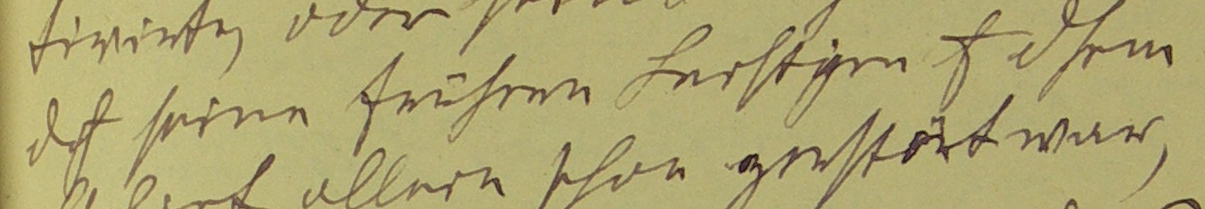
dch seine frühern Leistgen f dsem
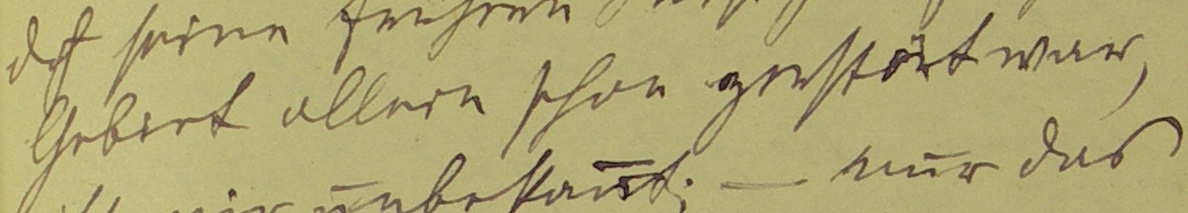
Gebiet allein schon zerstört war,
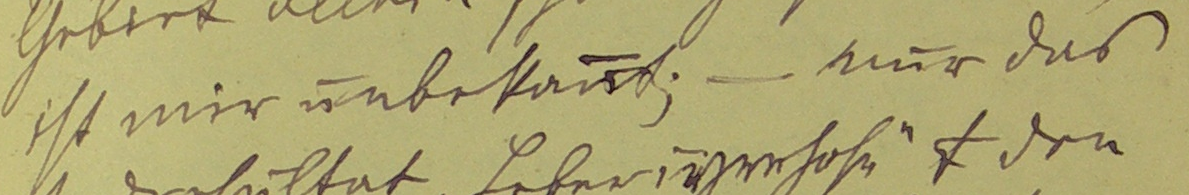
ist mir unbekannt; -- nur das
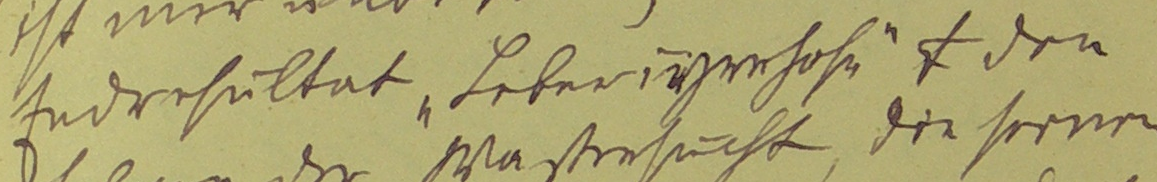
Endresultat „Lebercyrrhose“ t den
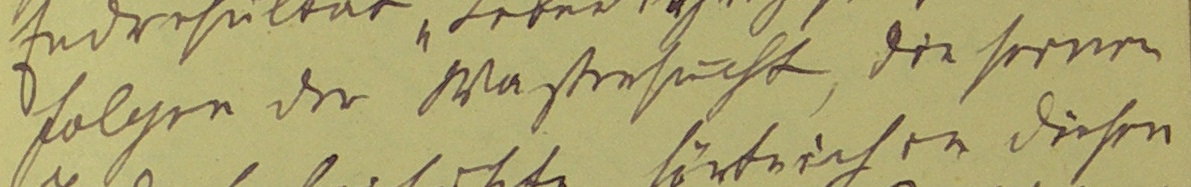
Folgen der Waßersucht, die seinen
